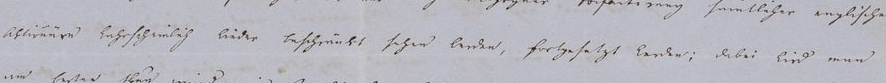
Aktionnäre wahrscheinlich wieder beschränkt sehen werden, fortgesetzt werden; dabei wird man
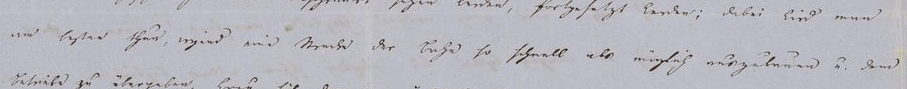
am besten thun, irgend eine Strecke der Bahn so schnell als möglich auszubauen u. dem
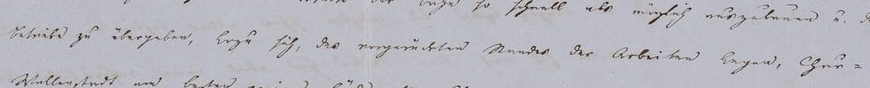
Betriebe zu übergeben, wozu sich, des vorgerückten Standes der Arbeiten wegen, Chur--
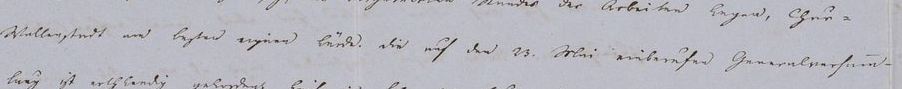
Wallenstadt am besten eignen würde. Die auf den 23. Mai einberufne Generalversamm-
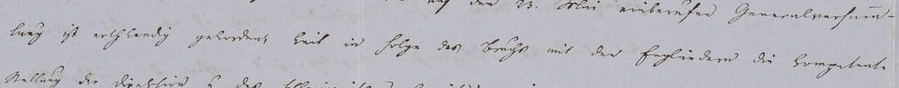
lung ist nothwendig geworden, weil in Folge des Bruchs mit den Engländern die kompetente
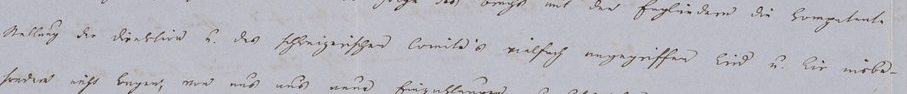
Stellung der Direktion u. des schweizerischen Comite's vielfach angegriffen wird u. wir insbe-
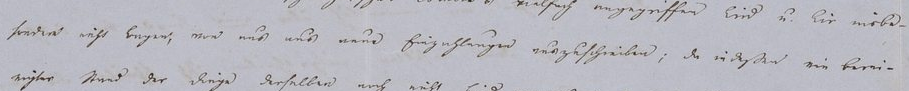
sondere nicht wagen, von uns aus neue Einzahlungen auszuschreiben; da indeßen ein berei-
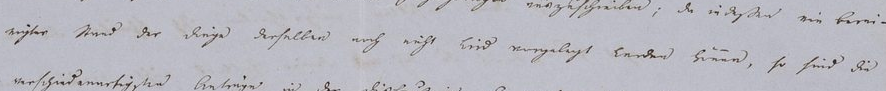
nigter Stand der Dinge derselben auch nicht wird vorgelegt werden können, so sind die
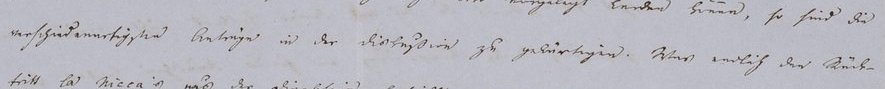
verschiedenartigsten Anträge in der Diskussion zu gewärtigen. Was endlich den Rück-
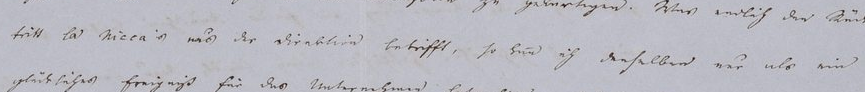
tritt La Nicca's aus der Direktion betrifft , so kann ich denselben nur als ein
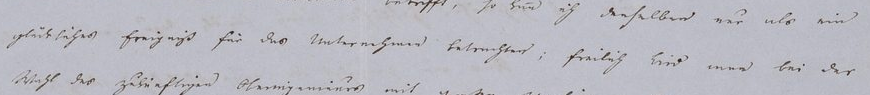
glückliches Ereigniß für das Unternehmen betrachten; freilich wird man bei der
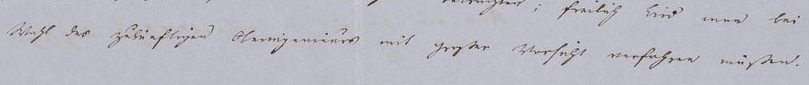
Wahl des zukünftigen Oberingenieurs mit großer Vorsicht verfahren müßen.
